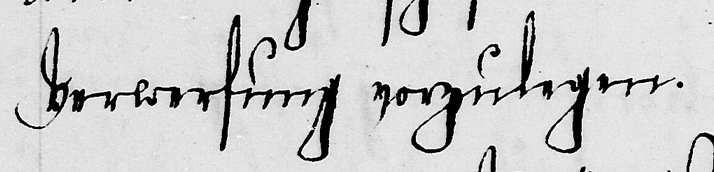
Verwerfung vorzulegen.
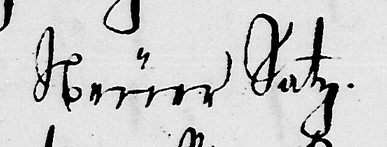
Neuer Satz.
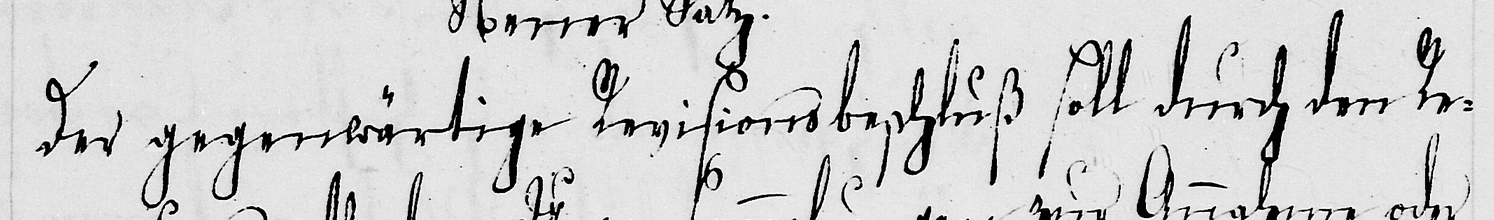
Der gegenwärtige Revisionsbeschluß soll durch den Re¬
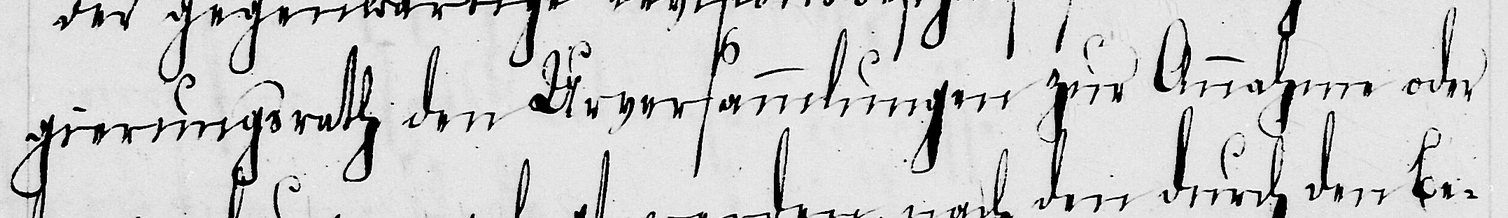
gierungsrath den Urversammlungen zur Annahme oder
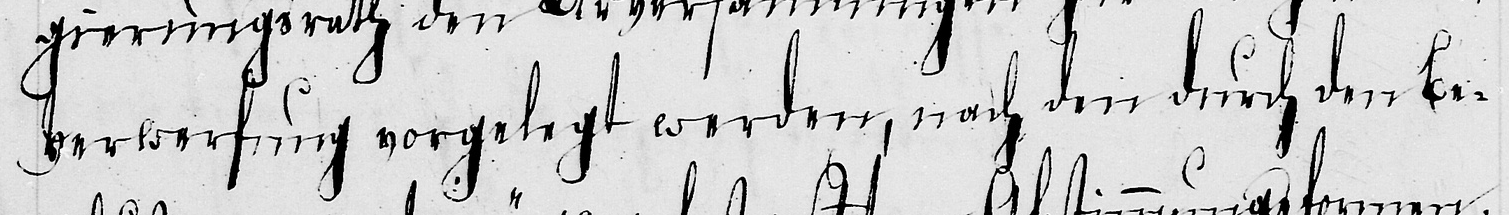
Verwerfung vorgelegt werden, nach den durch den Be¬
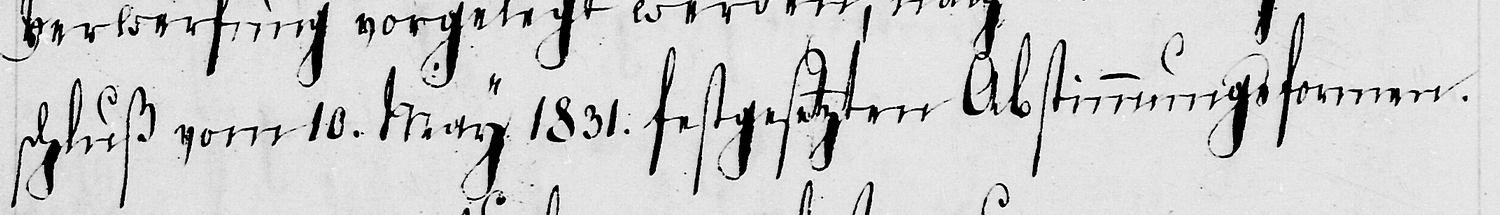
schluß vom 10. März 1831. festgesetzten Abstimmungsformen.
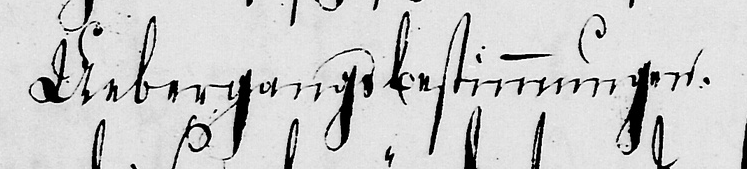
Uebergangsbestimmungen.
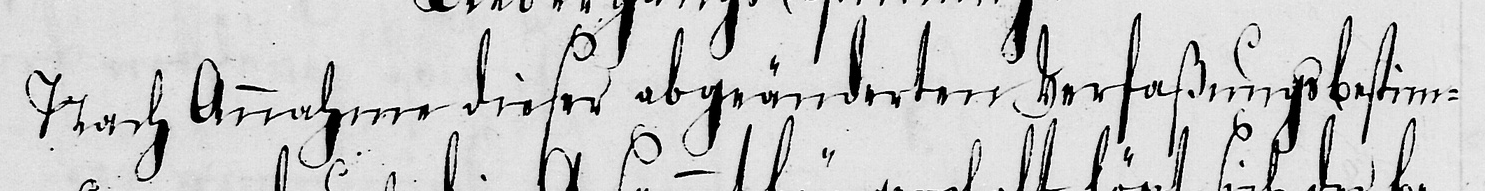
Nach Annahme dieser abgeänderten Verfaßungsbestim¬
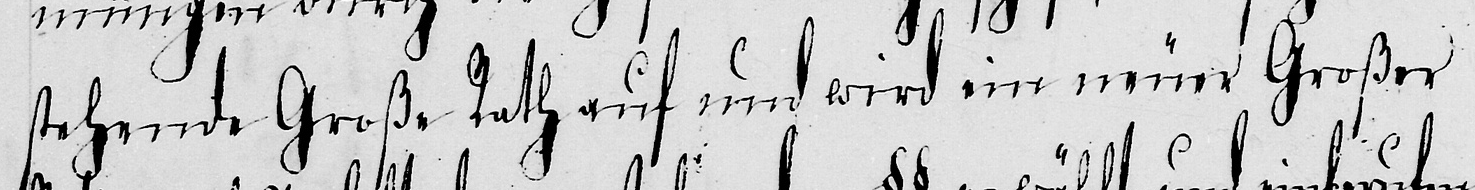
stehende Große Rath auf und wird ein neuer Großer
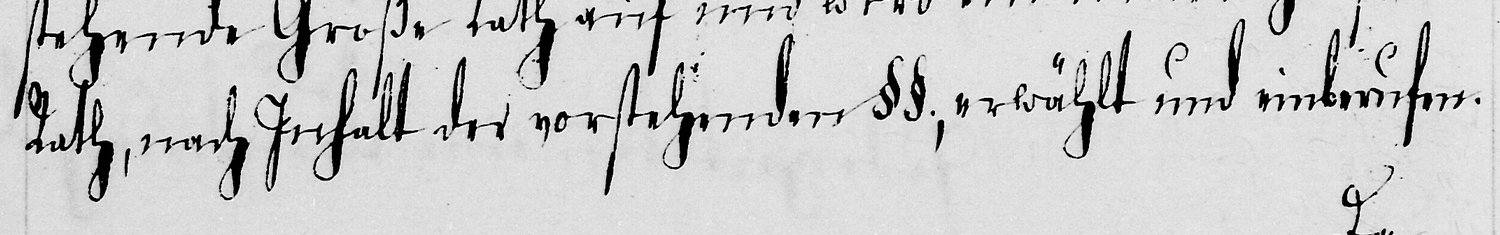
Rath, nach Inhalt der vorstehenden §§., erwählt und einberufe¬
